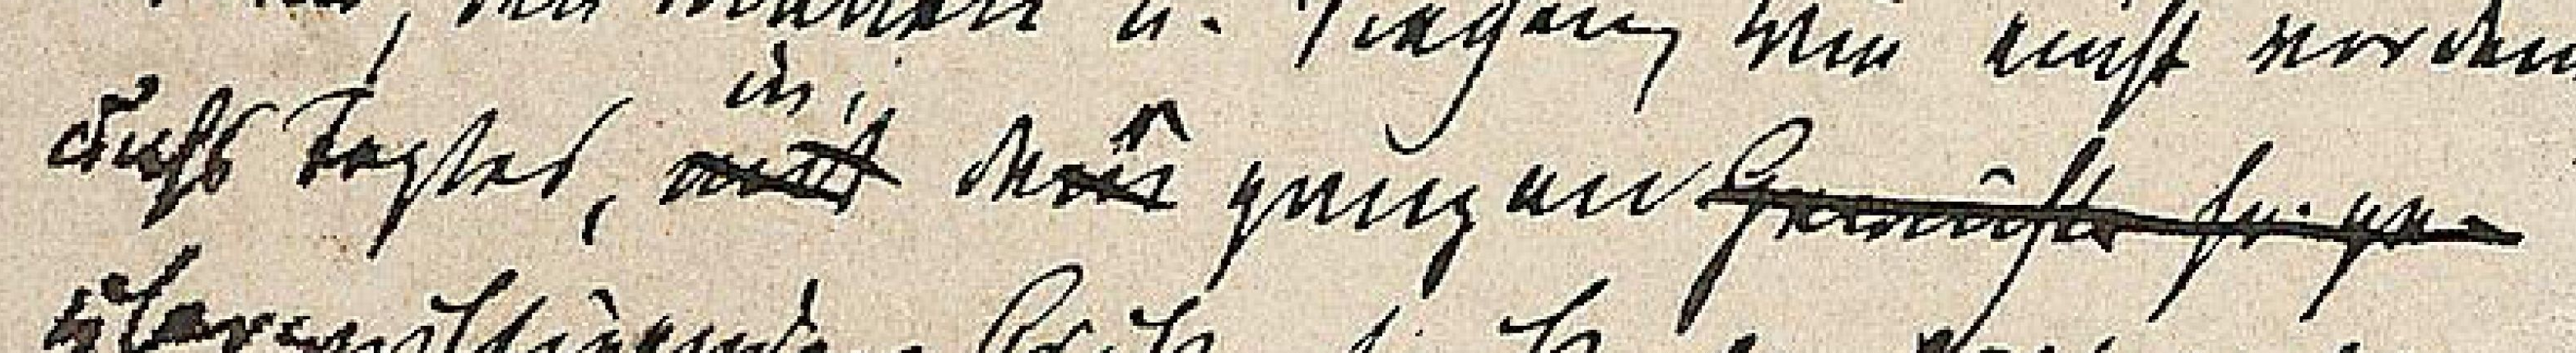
unss Textes, mit dem ganzen Gewichte sr ge.
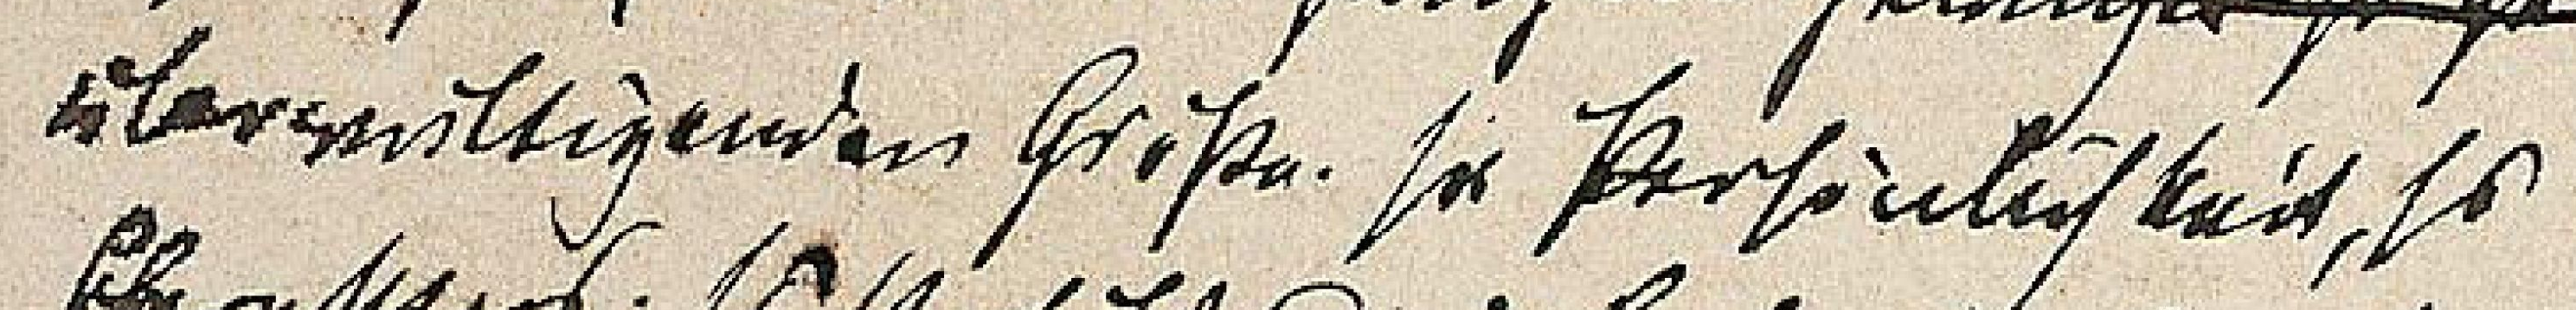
überwältigenden Größe. sr Persönlichkeit, ss
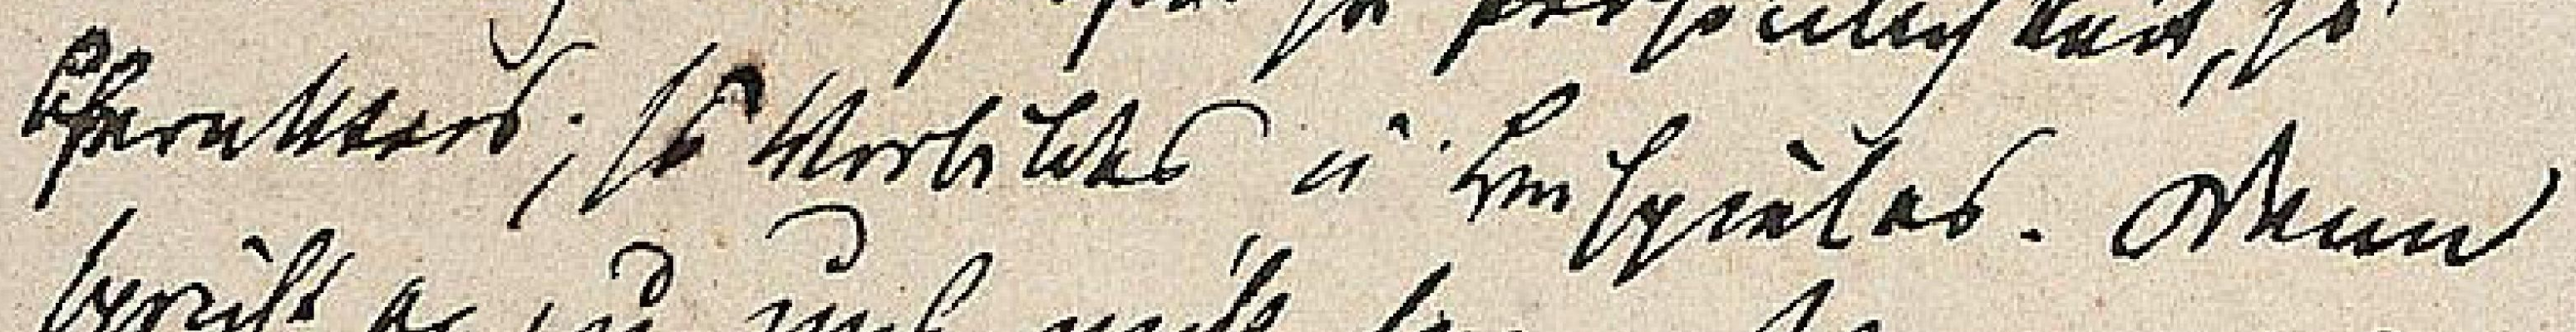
Charakters; ss Vorbildes u Beispieles. Dann
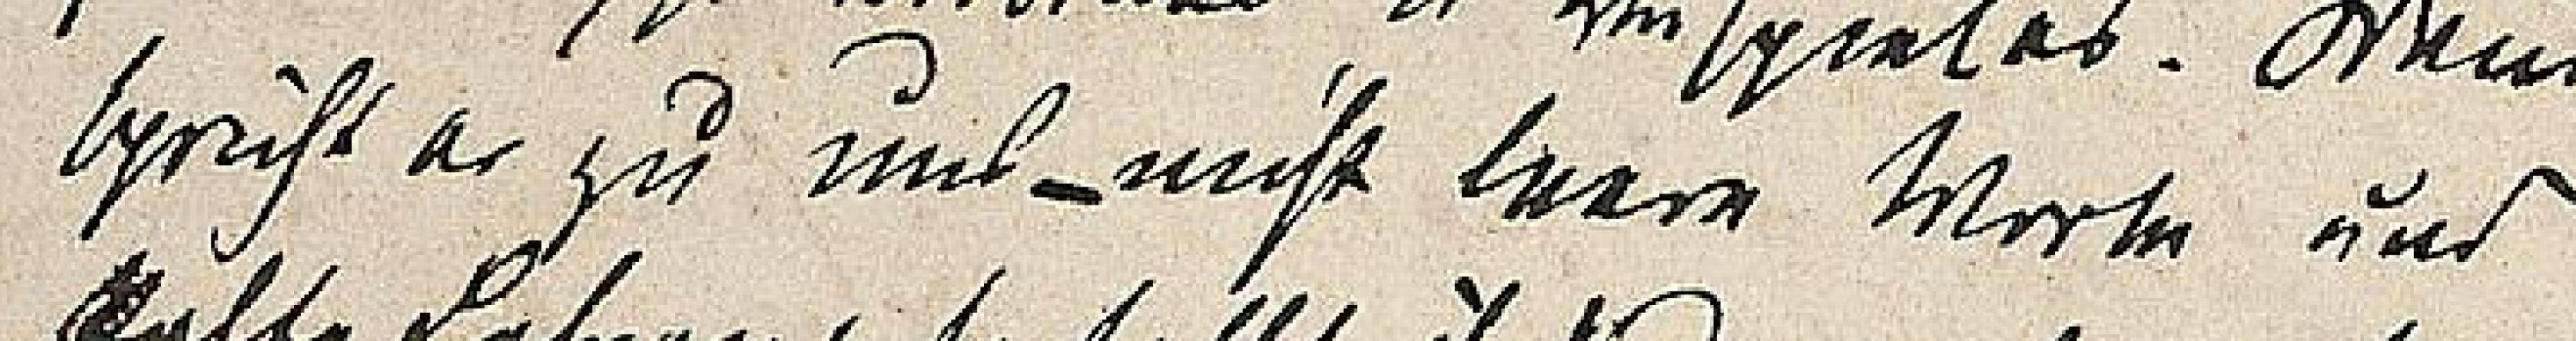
spricht er zu aus nicht leere Worte, und
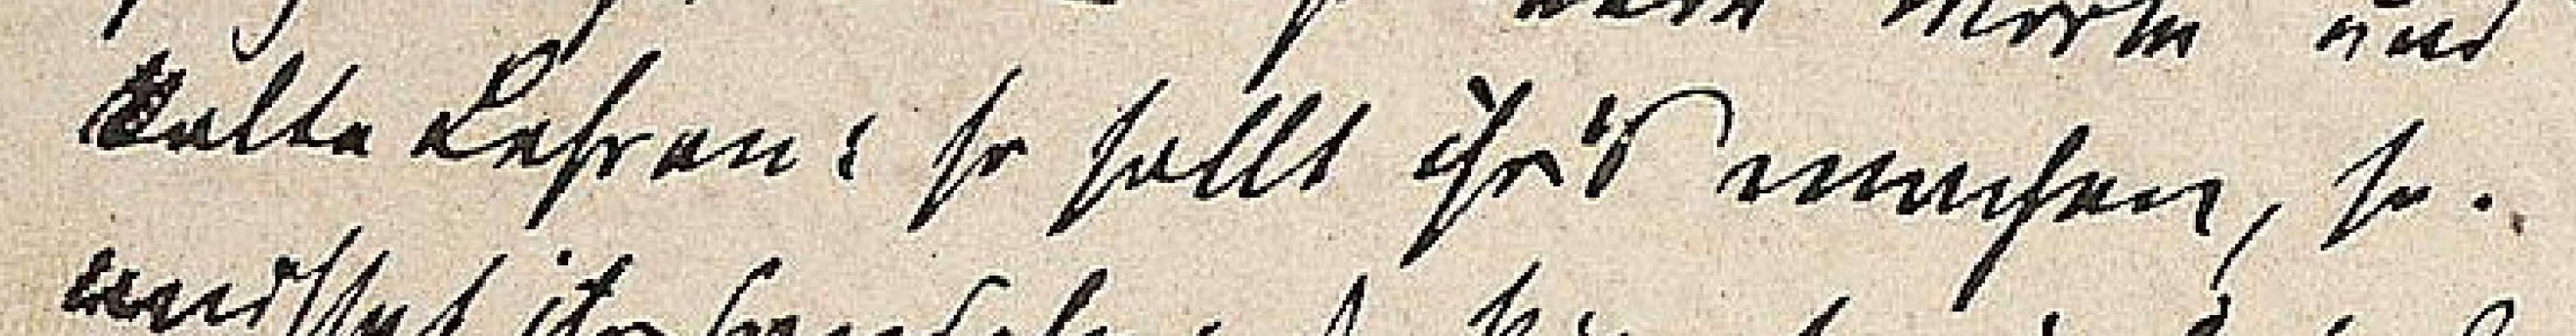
kalte Lehren: so sollt ihr's machen, so.
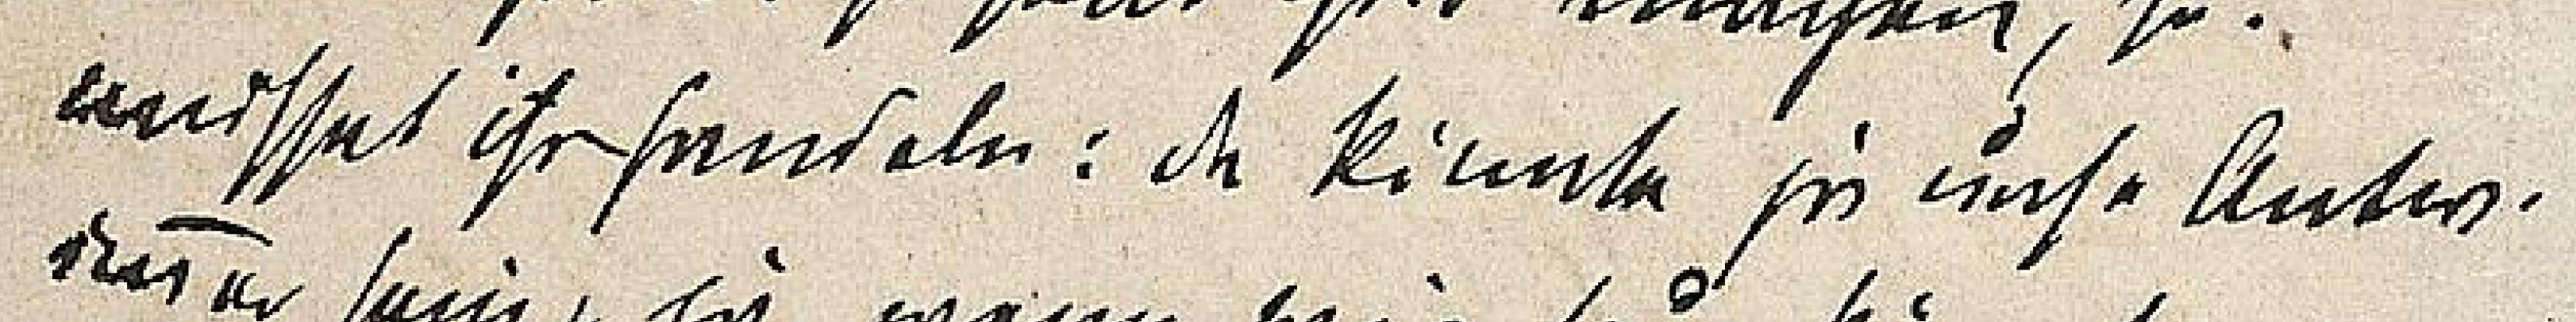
müsst ihr handeln: da könnte ja unsr. Antw.
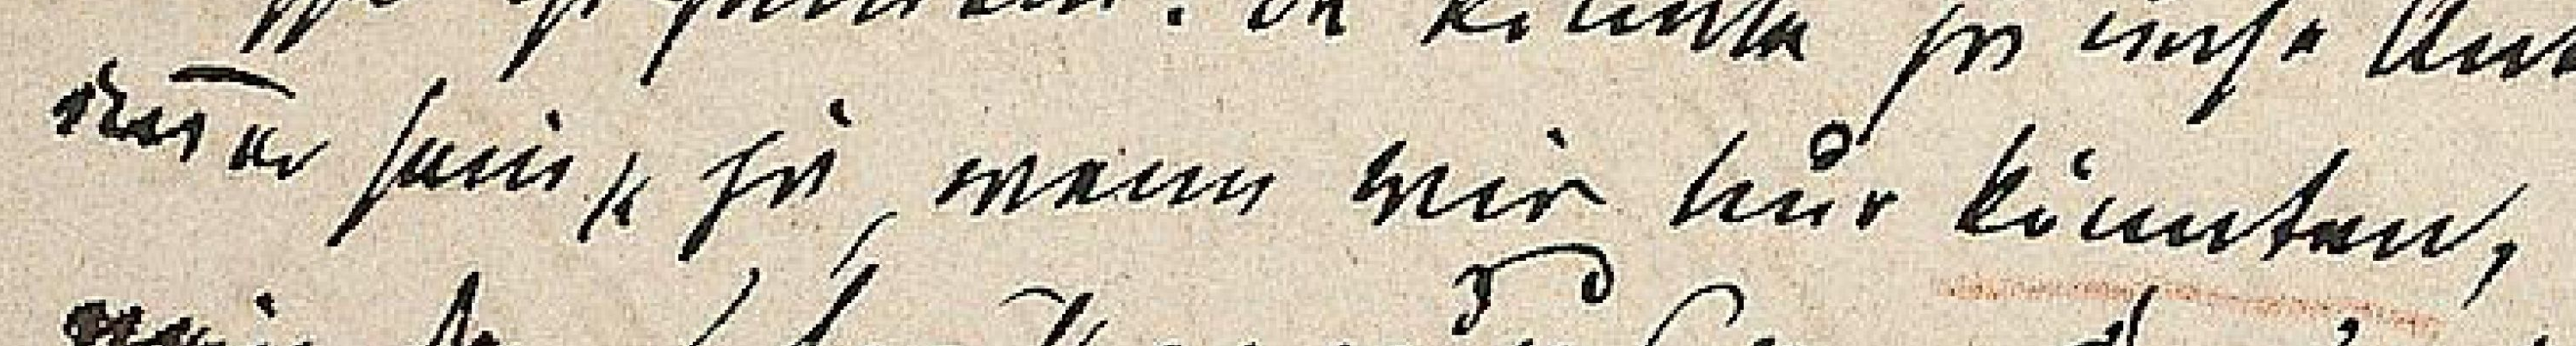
imer sein. ja, wenn wir nur könnten,
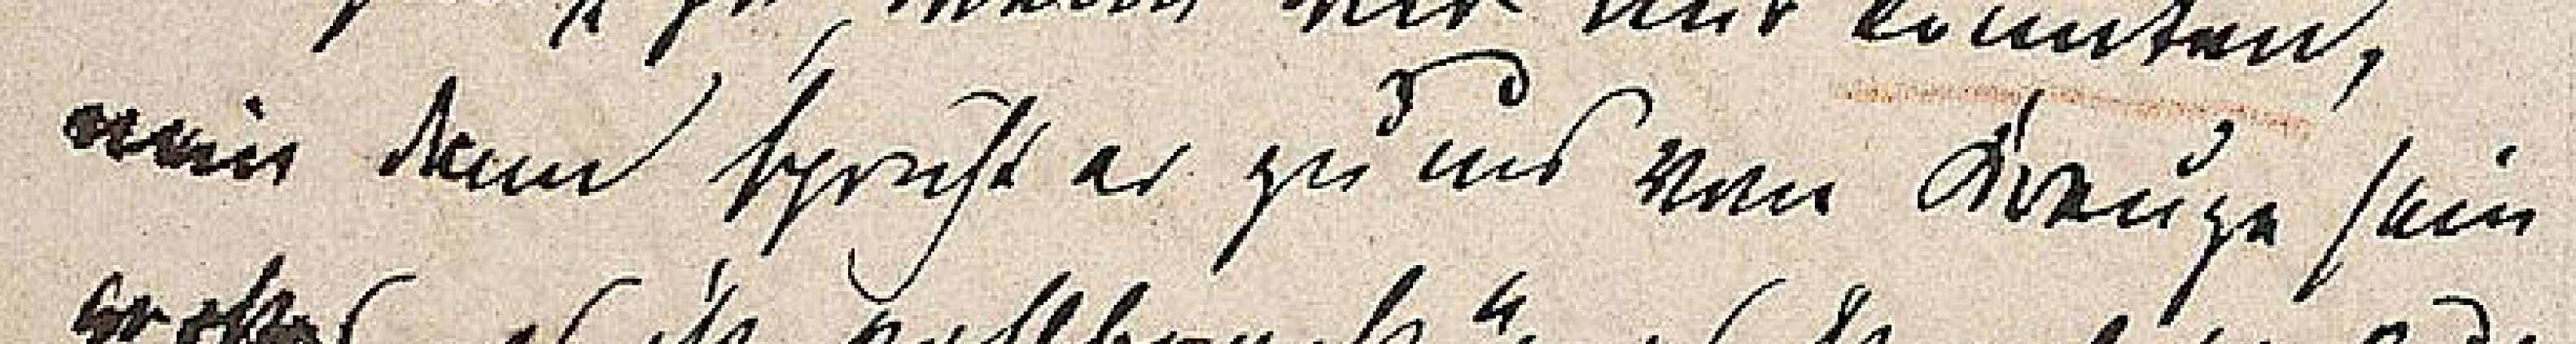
nein, dann spricht er zu aus vom Kreuze sein
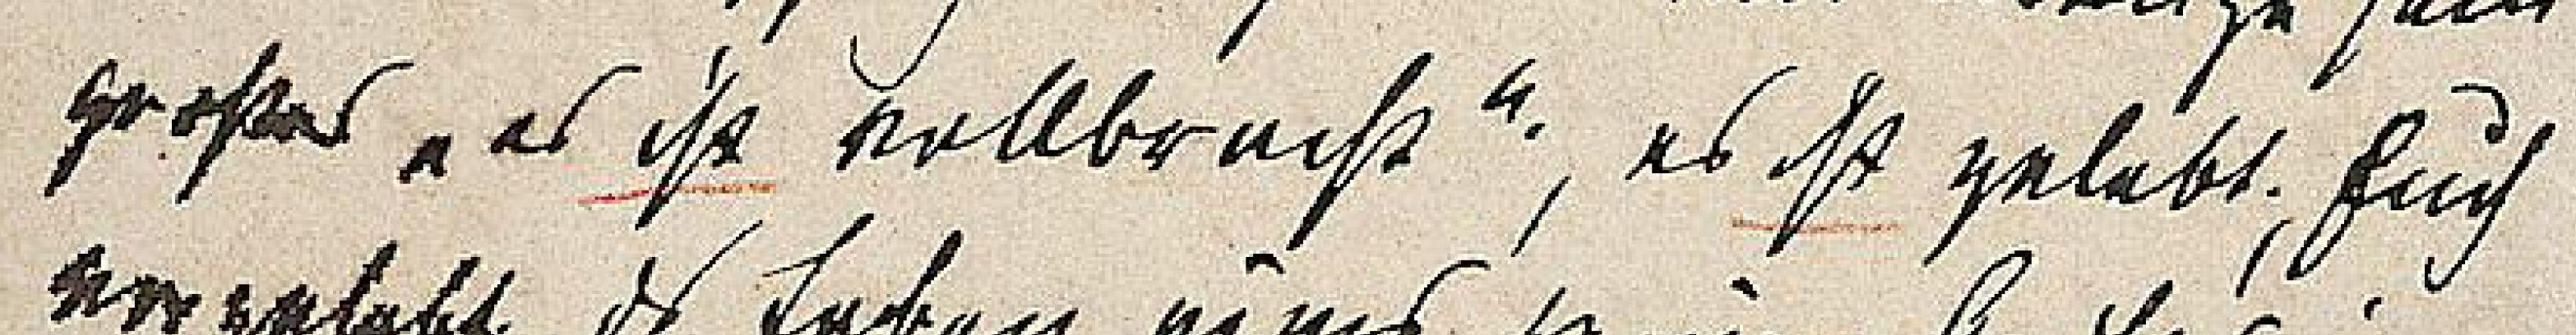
großes "es ist vollbracht" es ist gelebt. Euch
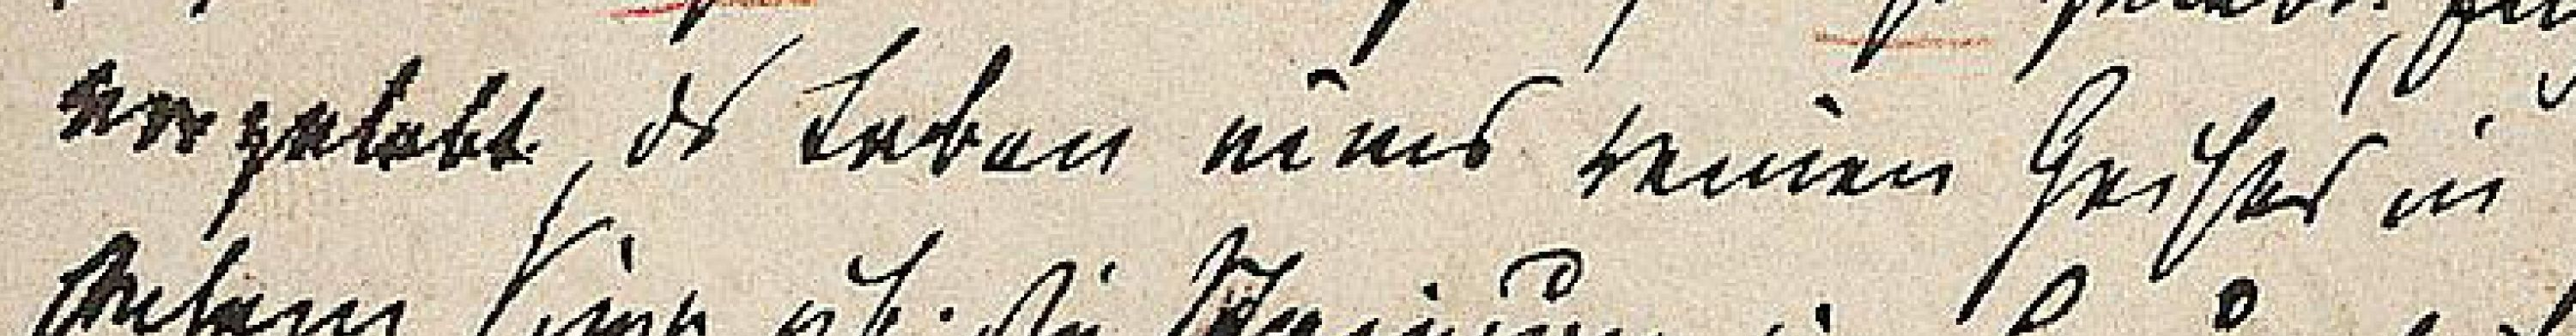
vorgelebt, das Leben eins reinen Geist in
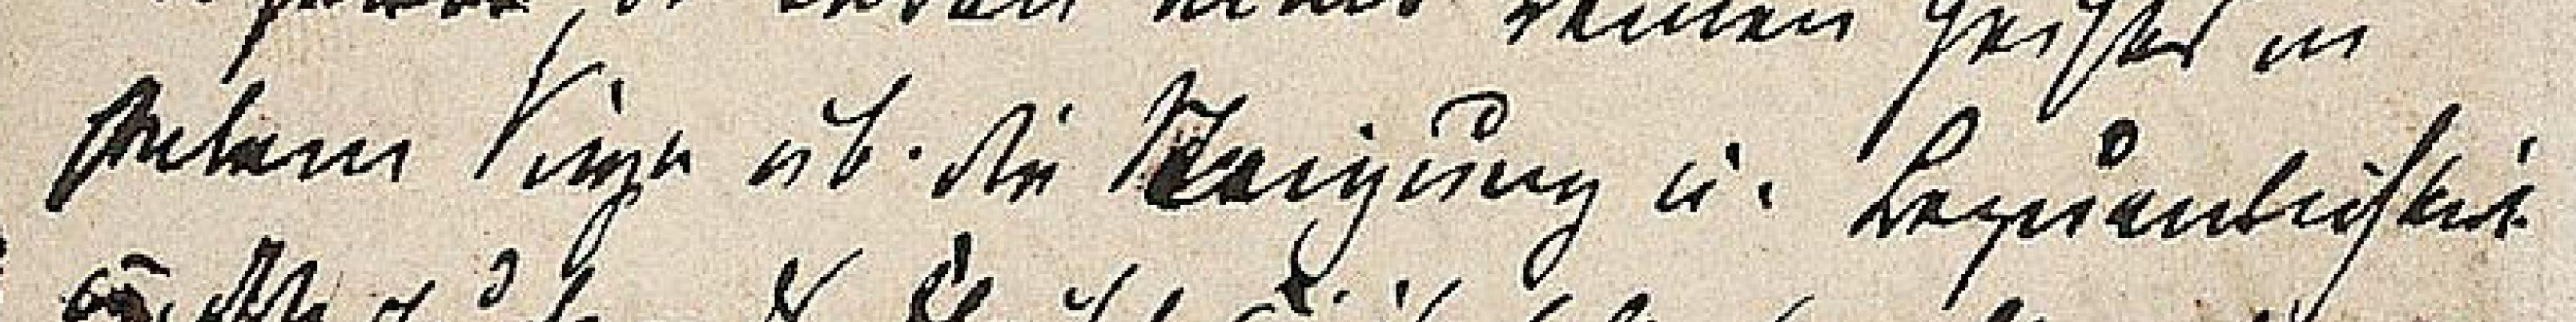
liebem Siege üb. die Neigung u. Bequemlichkeit
